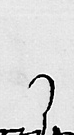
5.
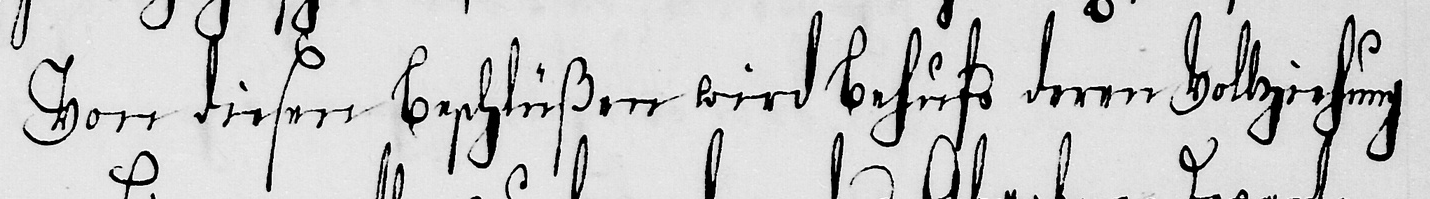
Von diesen Beschlüßen wird Behufs deren Vollziehung
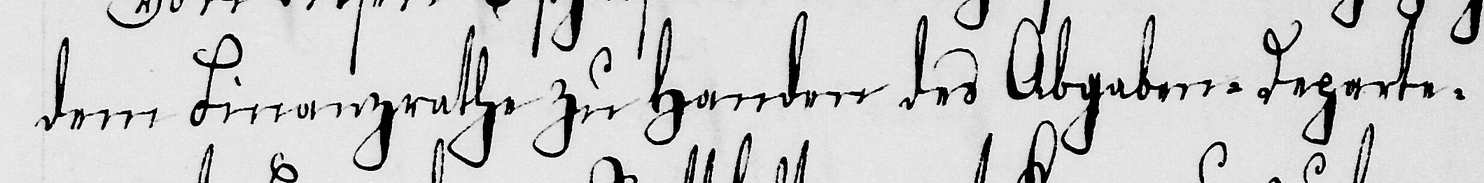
dem Finanzrathe zu Handen des Abgaben-Departe¬
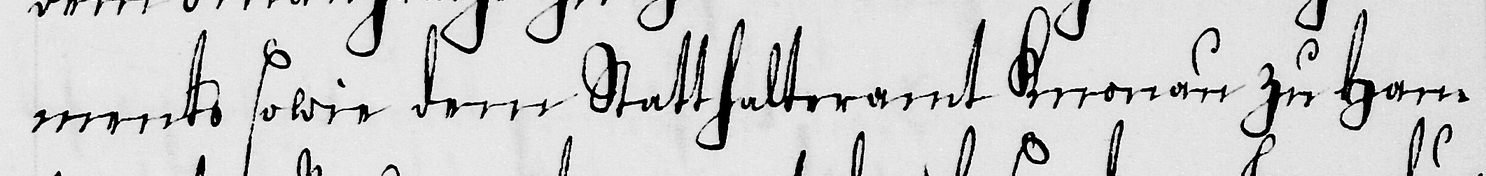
ments sowie dem Statthalteramt Knonau zu Han¬
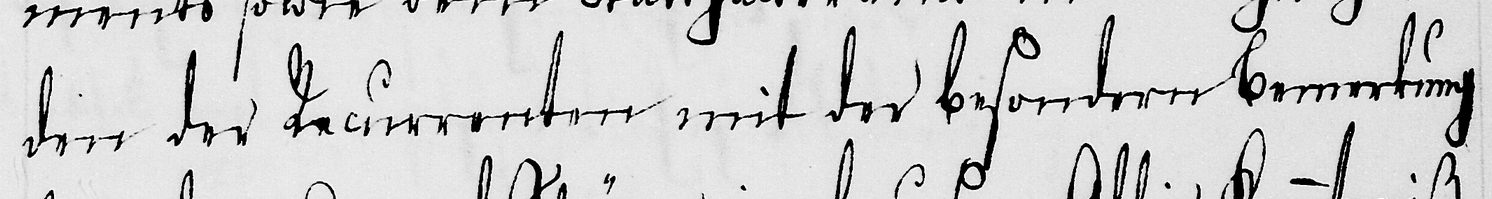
den der Recurrenten mit der besondern Bemerkung
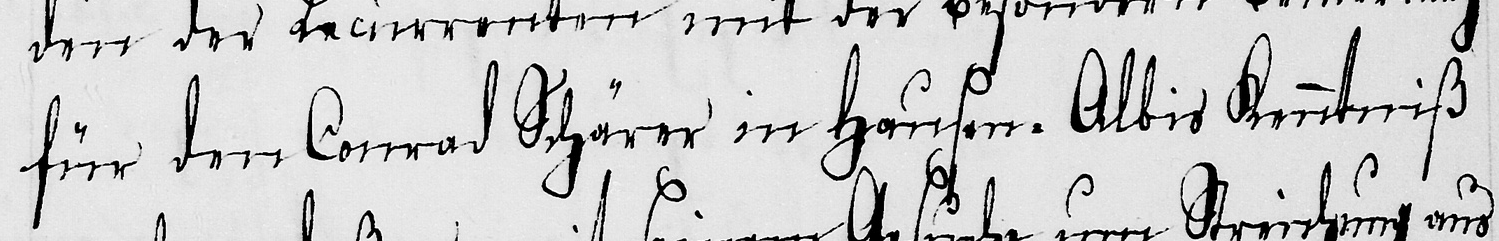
für den Conrad Schärer in Hausen-Albis Kenntniß
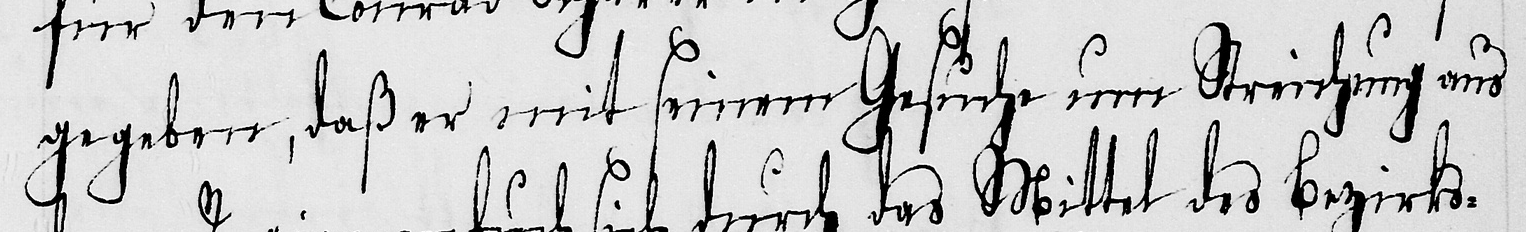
gegeben, daß er mit seinem Gesuche um Streichung aus
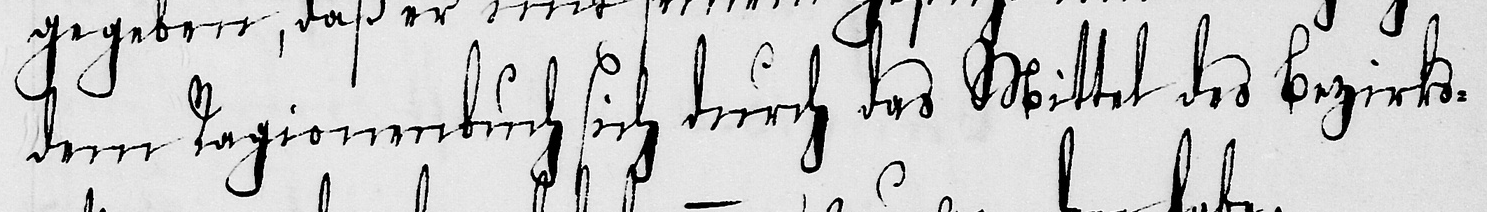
dem Ragionenbuch sich durch das Mittel des Bezirks¬
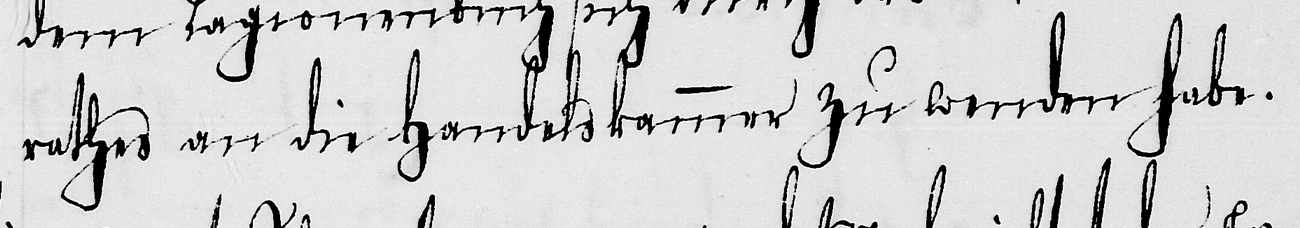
rathes an die Handelskammer zu wenden habe.
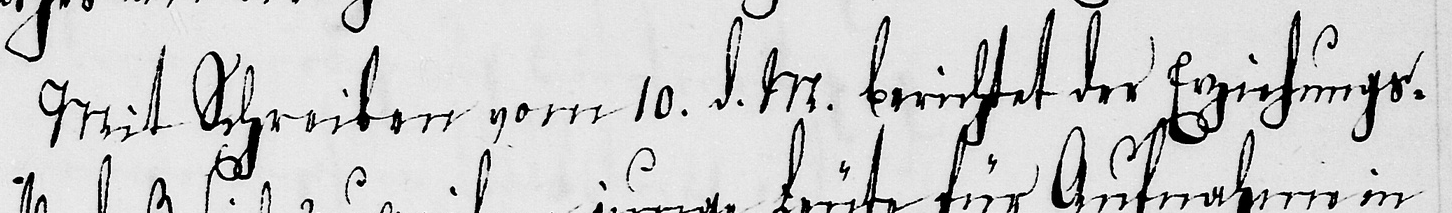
Mit Schreiben vom 10. d. M. berichtet der Erziehungs¬
